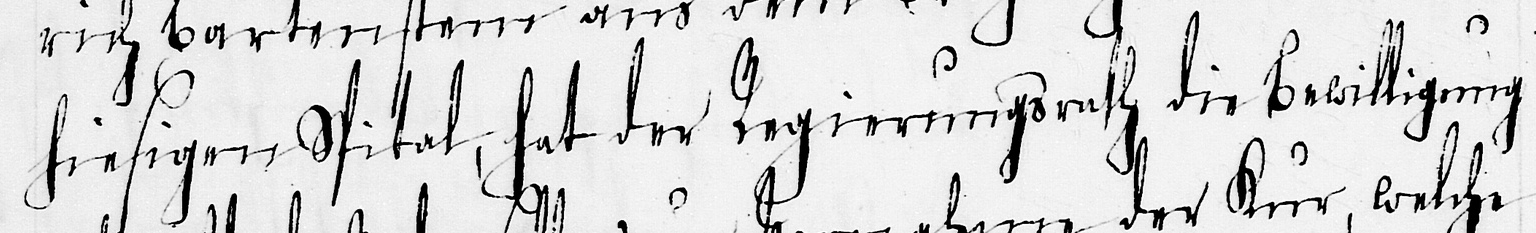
hiesigen Spital, hat der Regierungsrath die Bewilligung
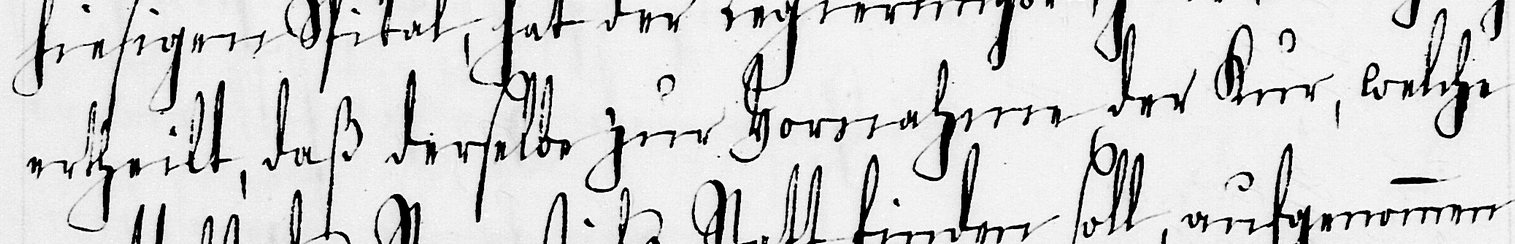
ertheilt, daß derselbe zur Vornahme der Kur, welche
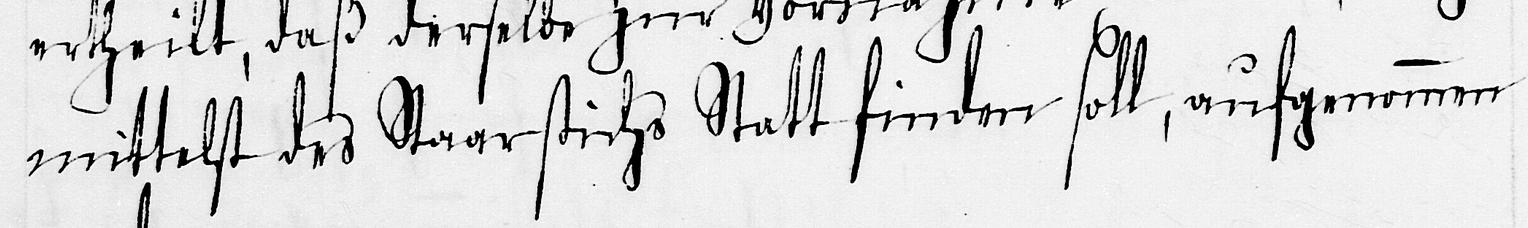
mittelst des Staarstichs Statt finden soll, aufgenommen
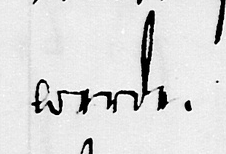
werde.
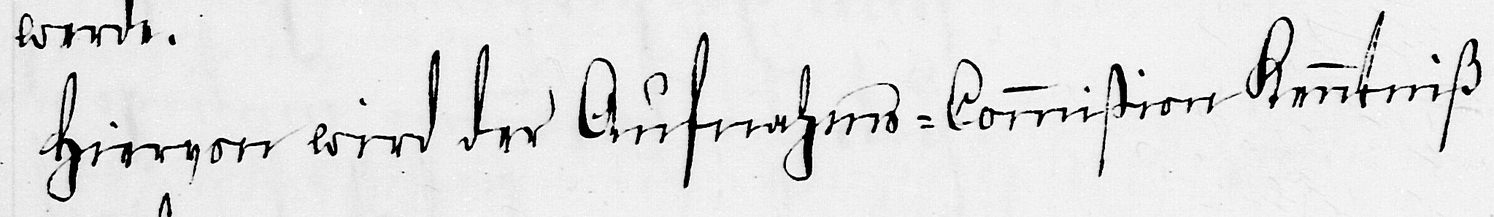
Hiervon wird der Aufnahms-Commißion Kenntniß
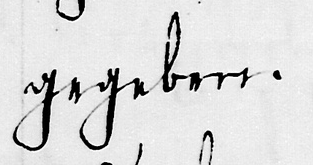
gegeben.
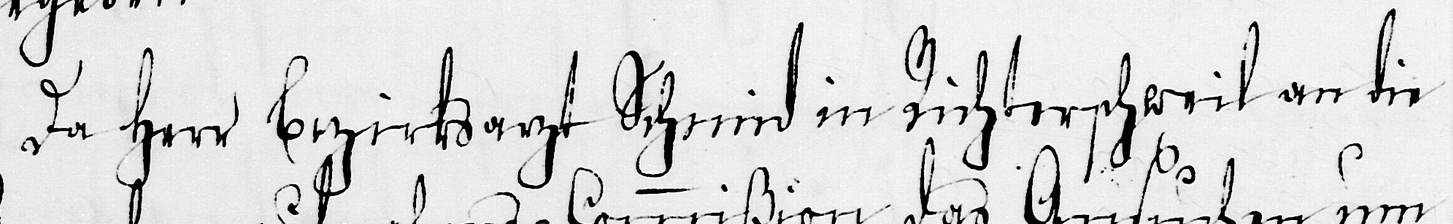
Da Herr Bezirksarzt Schmid in Richterschweil an die
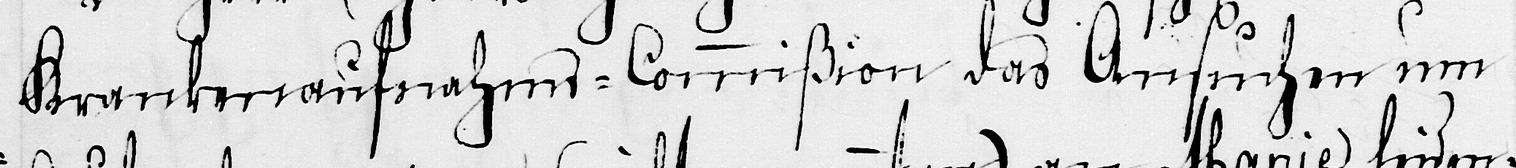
Krankenaufnahms-Commißion das Ansuchen um
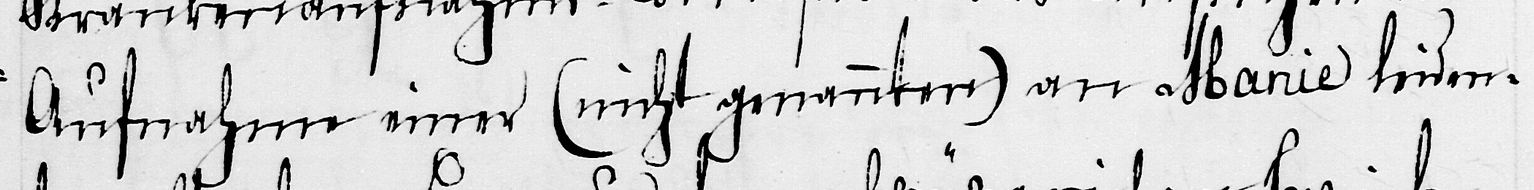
Aufnahme einer (nicht genannten) an Manie leiden¬
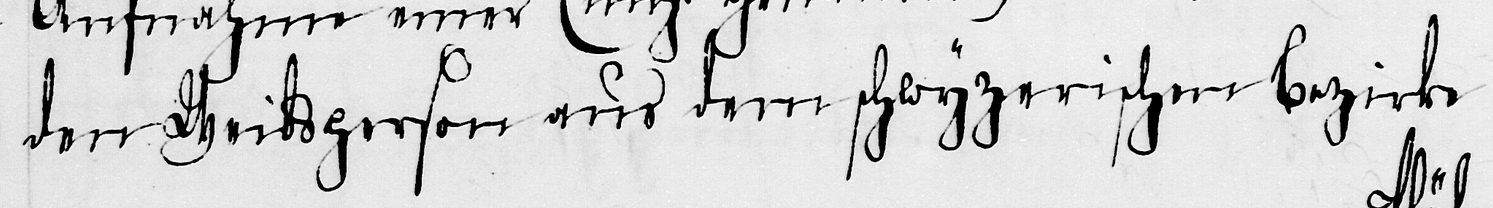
den Weibsperson aus dem schwyzerischen Bezirke
